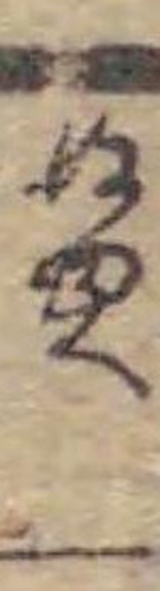ぬゆへ
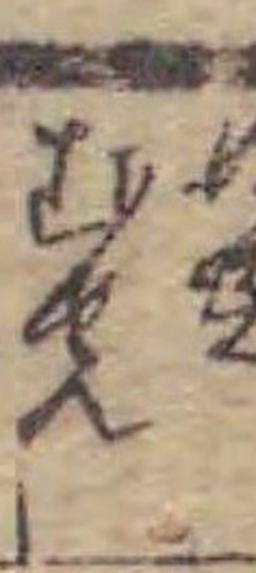むせん
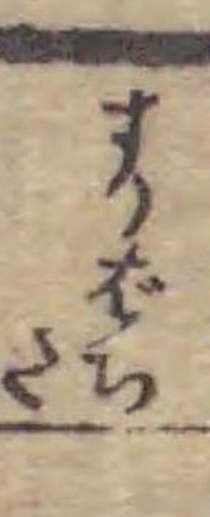すりばち
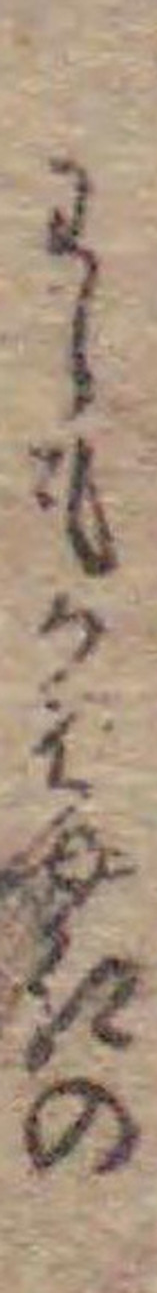わしもかはやきの
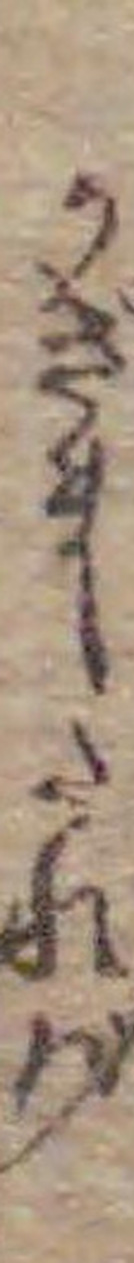かぎましたれば
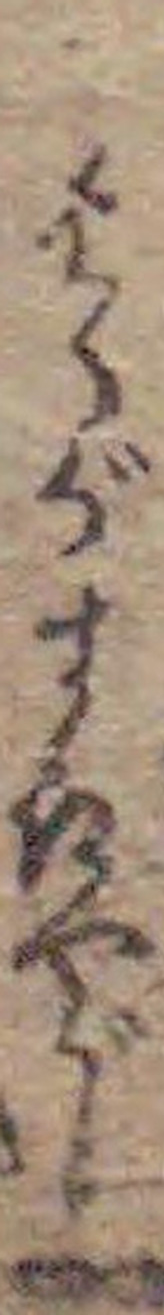はらがすきやした
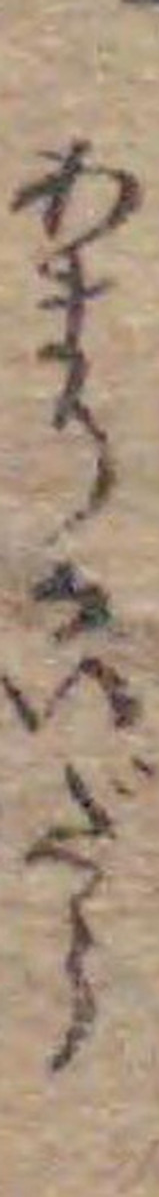あまりかいだら
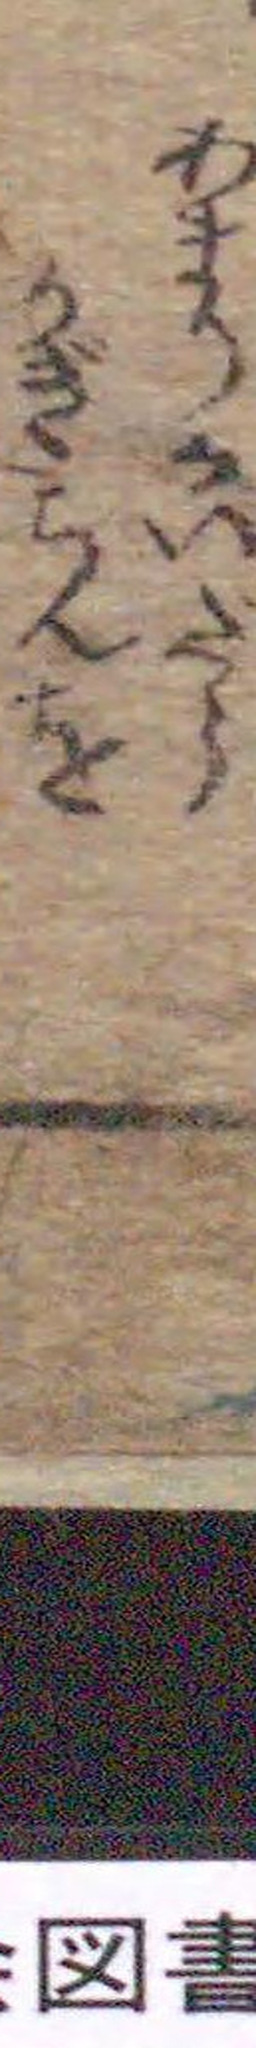かぎちんを
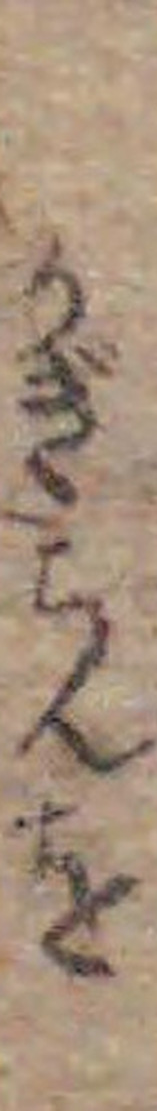かぎちんを
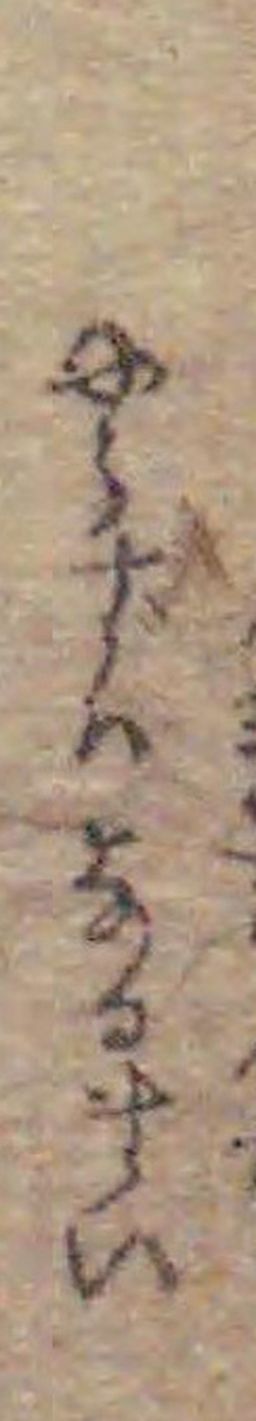やらずはなるまい
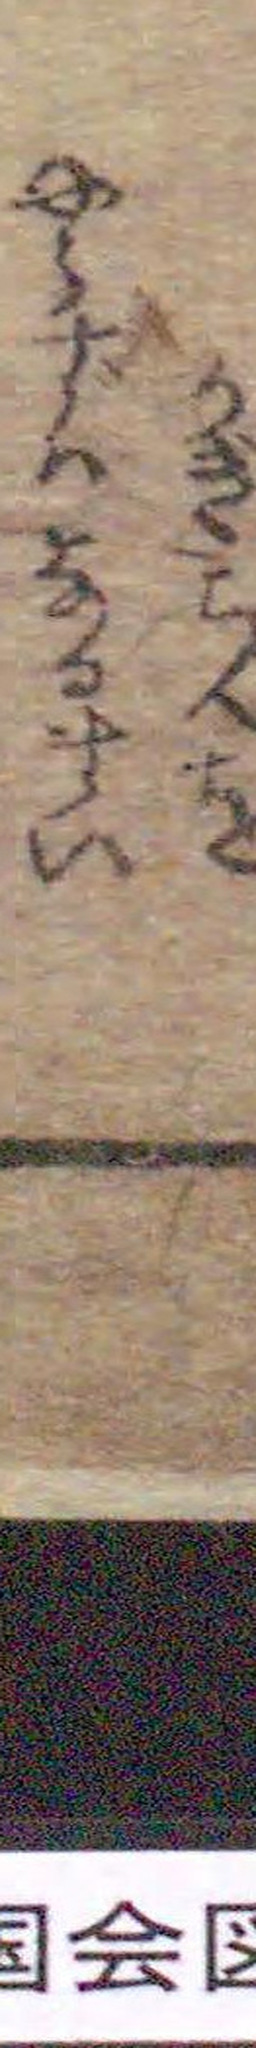やらずはなるまい
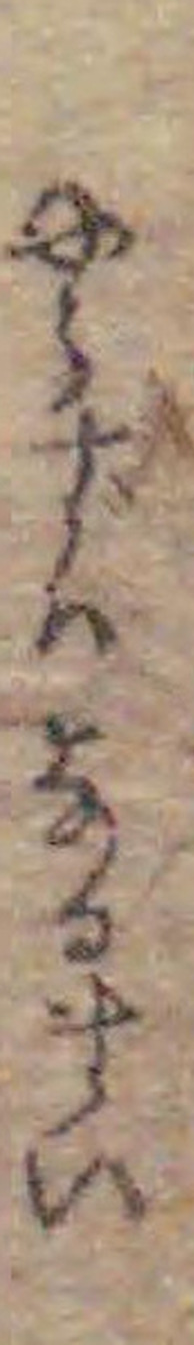やらずはなるまい
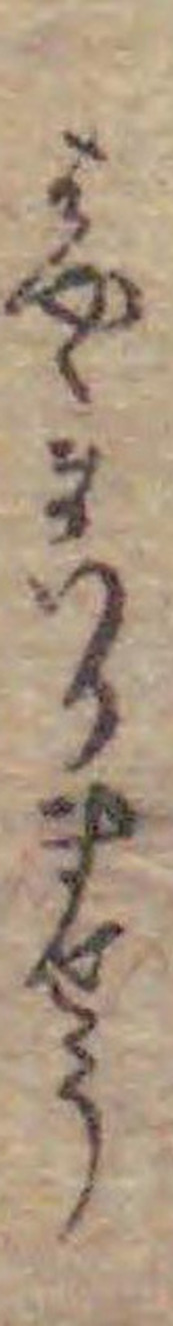はやくまいりませう

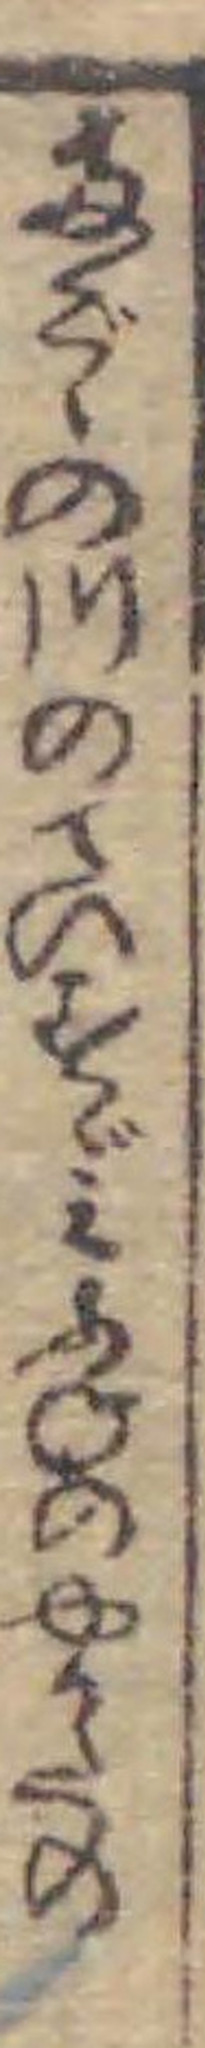両ごくの川のていすゞみふねのやかたの
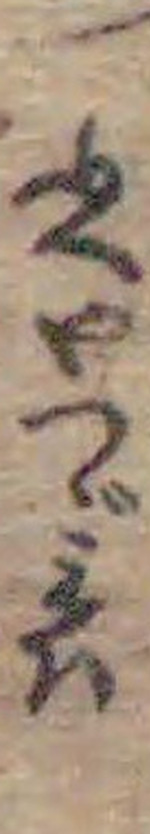ふへやつゞみは
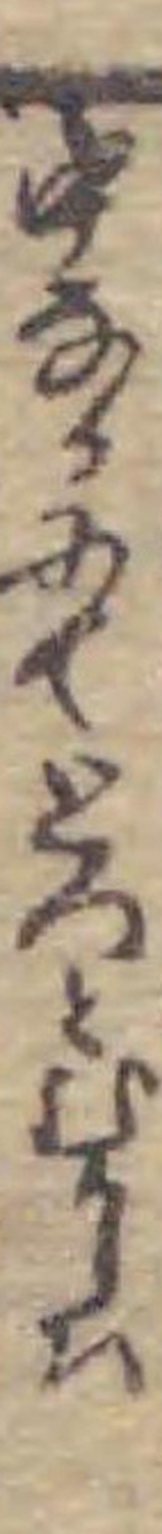中なかにてとつとむかしは
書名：威気千代牟物語 : 2巻
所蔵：国立国会図書館 National Diet Library, JAPAN
